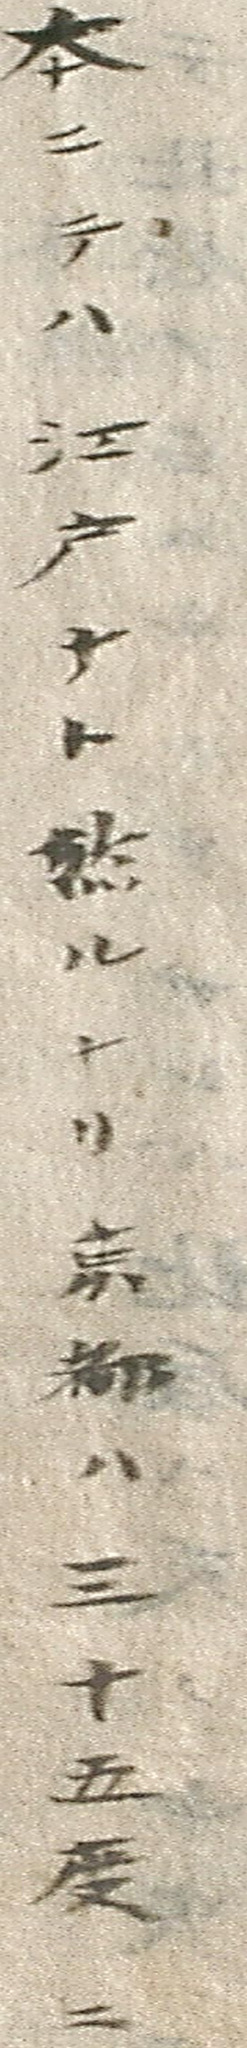本ニテハ江戸ナト然ルナリ京都ハ三十五度ニ
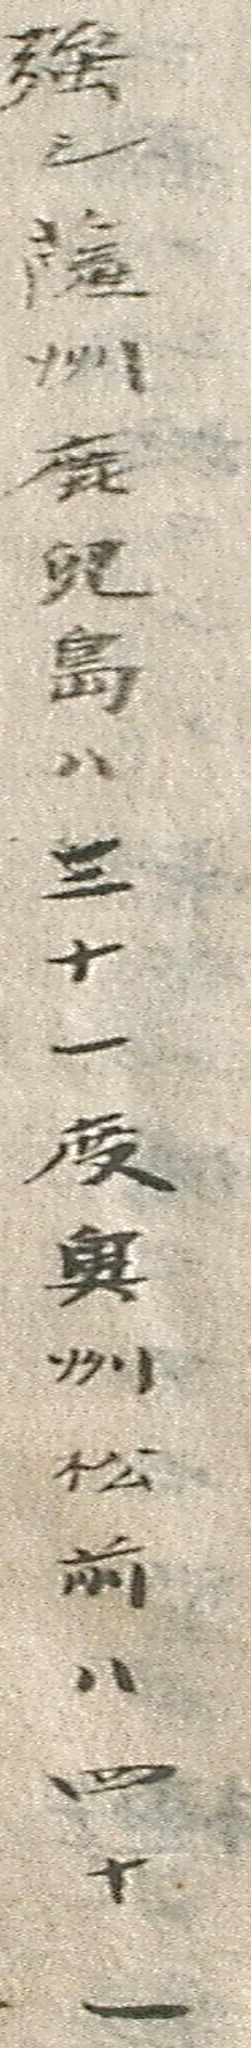強シ薩州鹿児島ハ三十一度奥州松前ハ四十一
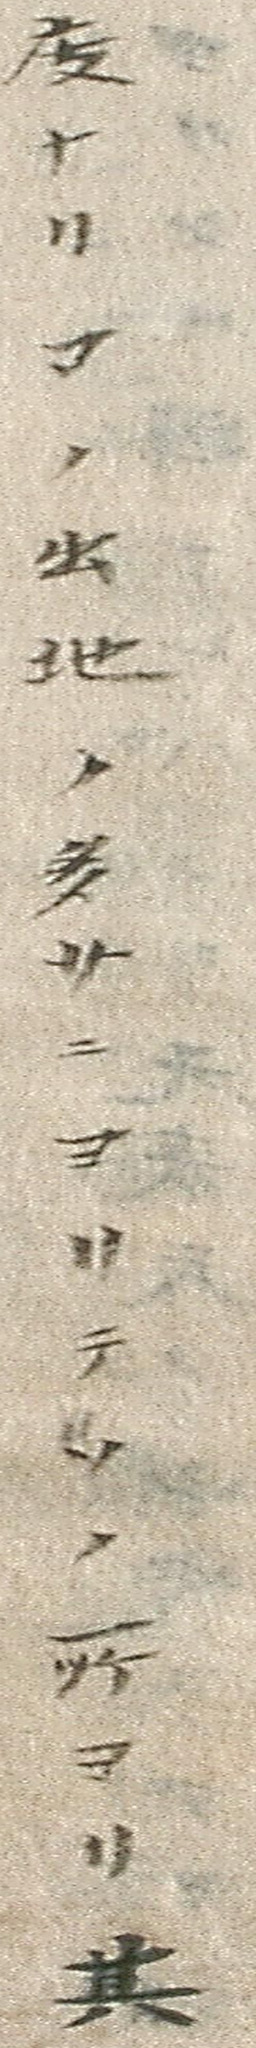度ナリコノ出地ノ多サニヨリテソノ所ヨリ其
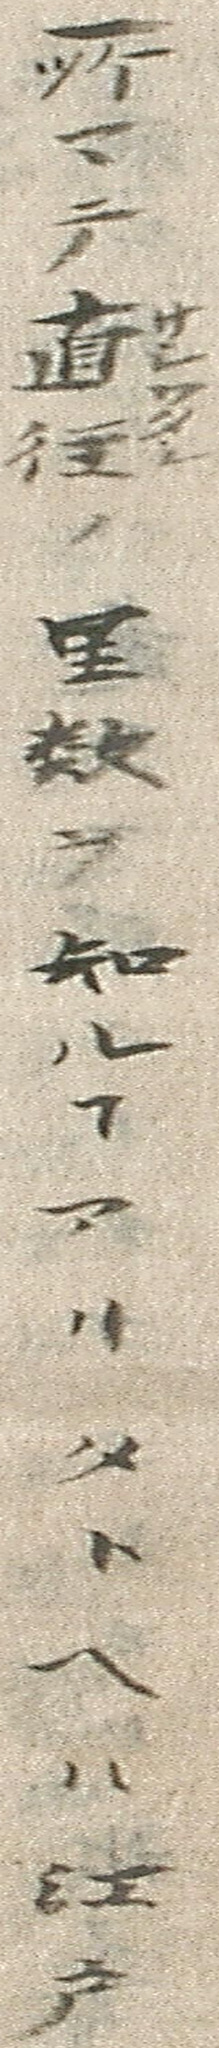所マテ直径ノ里数ヲ知ルヿアリタトヘハ江戸
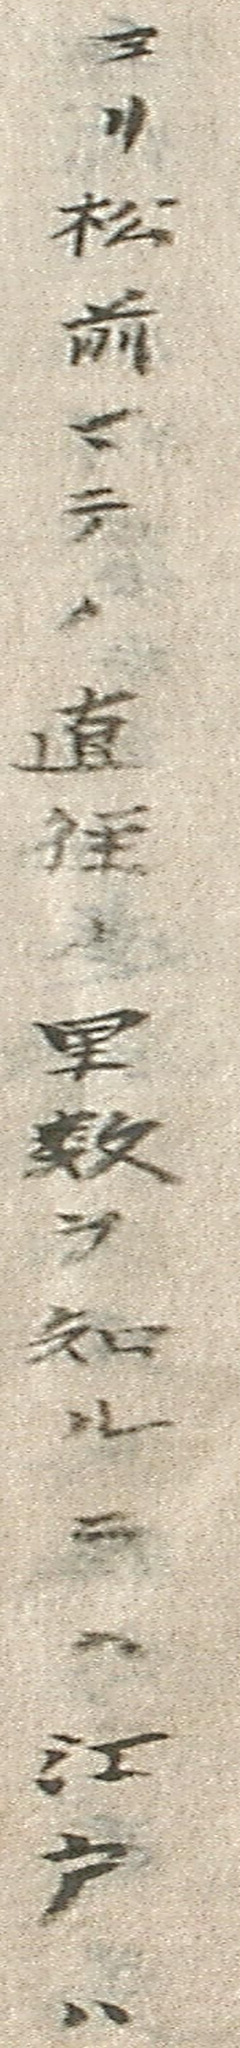ヨリ松前マテノ直径ノ里数ヲ知ルニハ江戸ハ
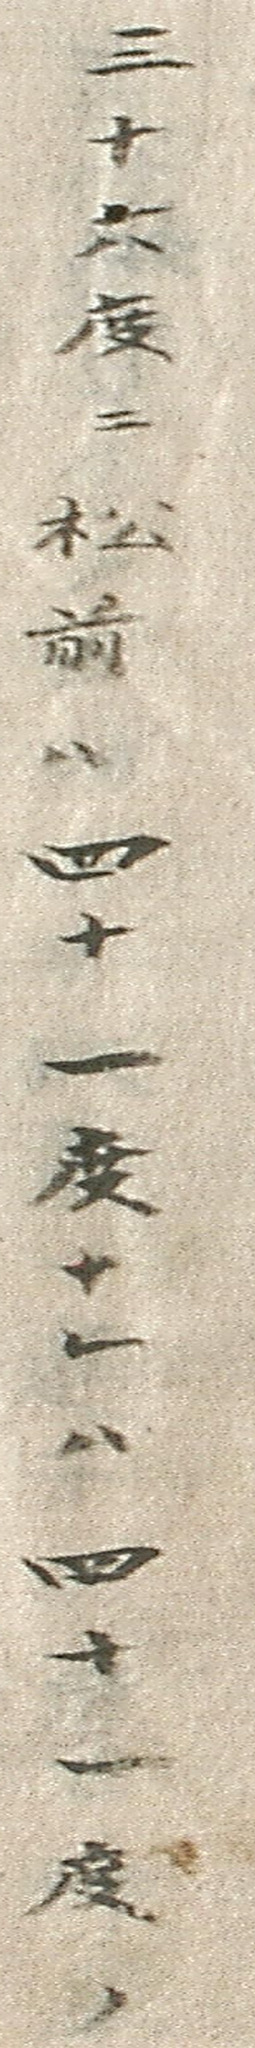三十六度ニ松前ハ四十一度ナレハ四十一度ノ
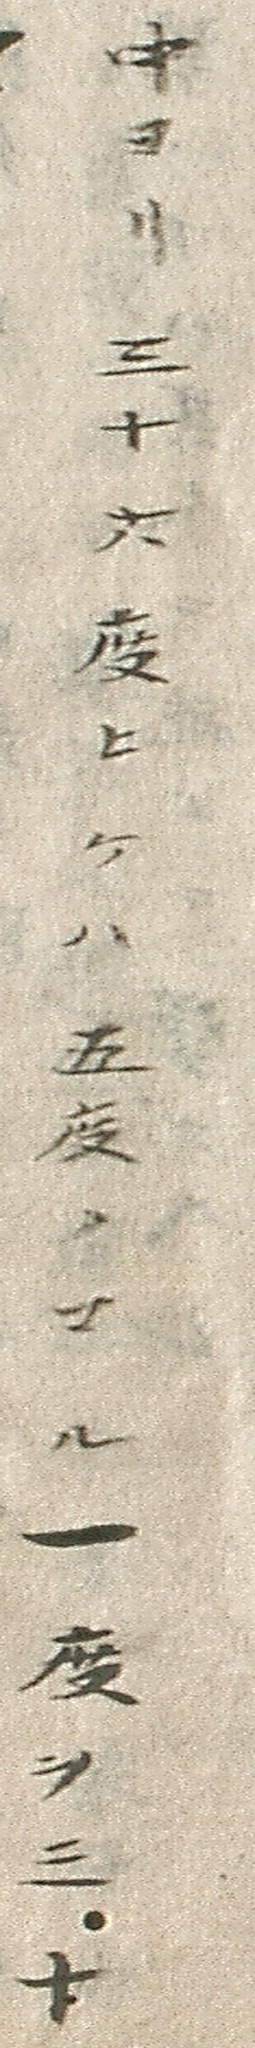中ヨリ三十六度ヒケハ五度ノコル一度ヲ三十
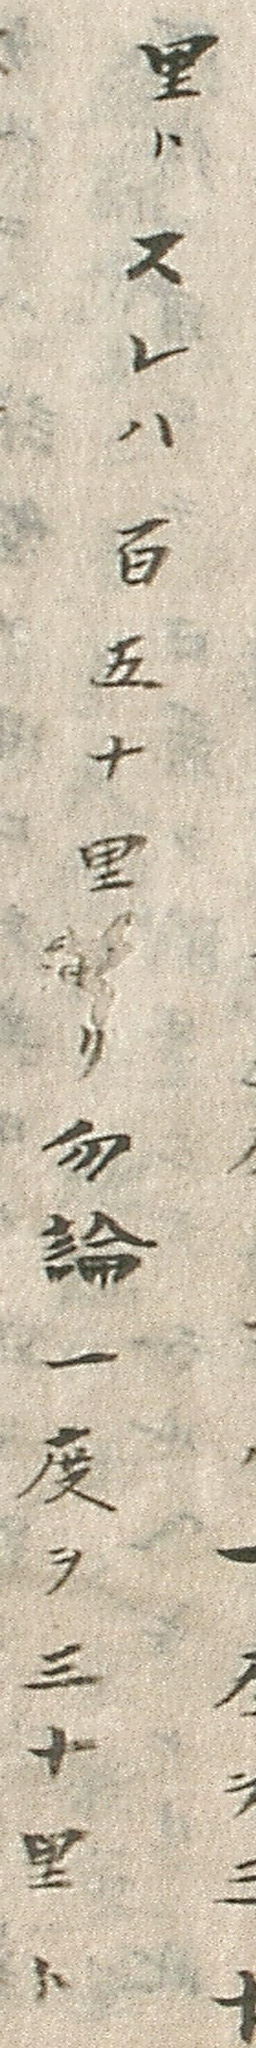里トスレハ百五十里ナリ勿論一度ヲ三十里ト
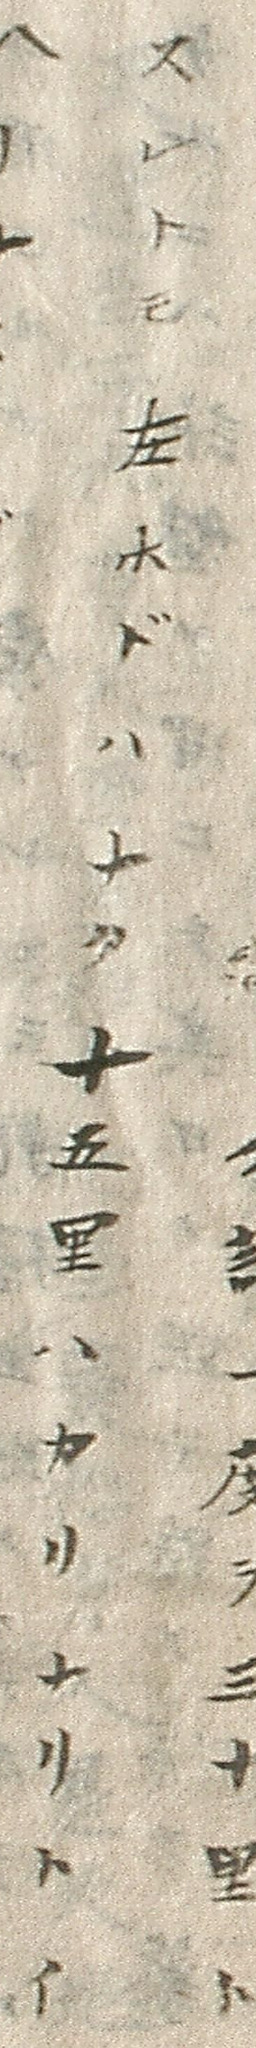スレトモ左ホドハナク十五里ハカリナリトイ
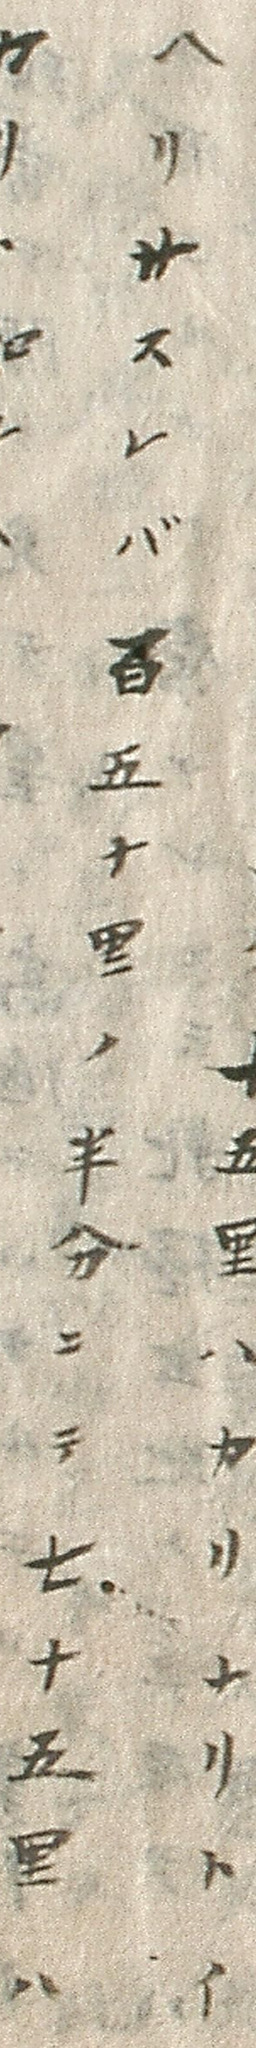ヘリサスレバ百五十里ノ半分ニテ七十五里ハ
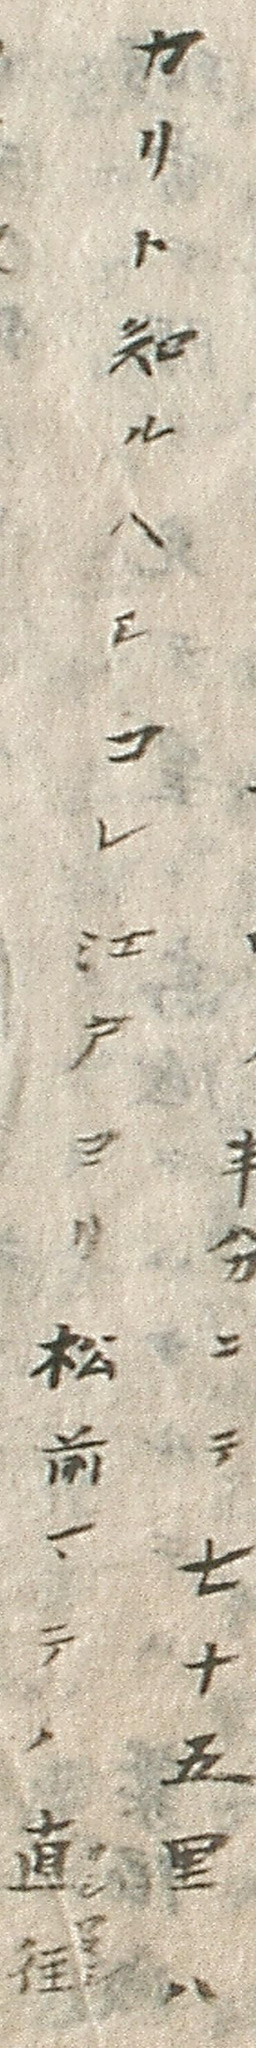カリト知ルヘシコレ江戸ヨリ松前マテノ直径
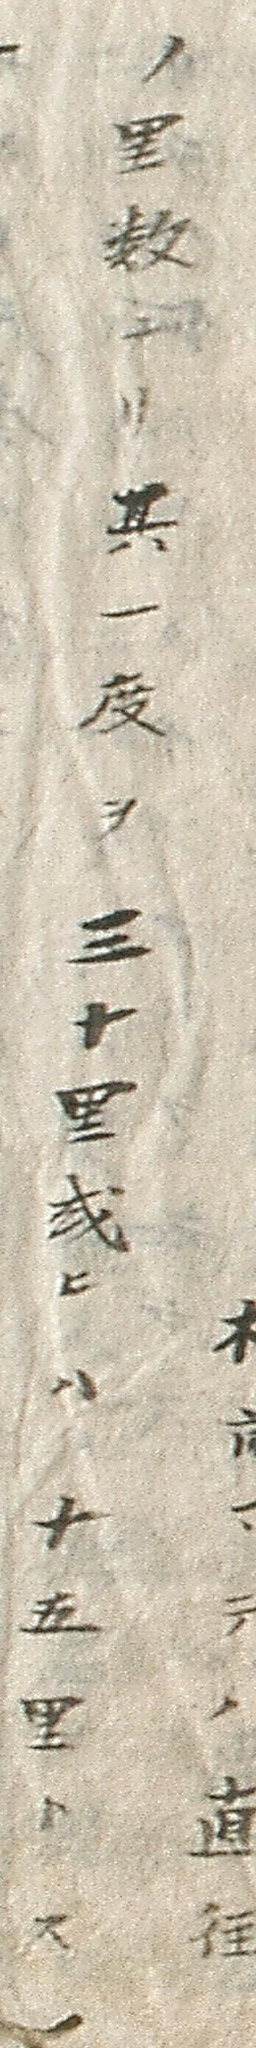ノ里数ナリ其一度ヲ三十里或ヒハ十五里トス
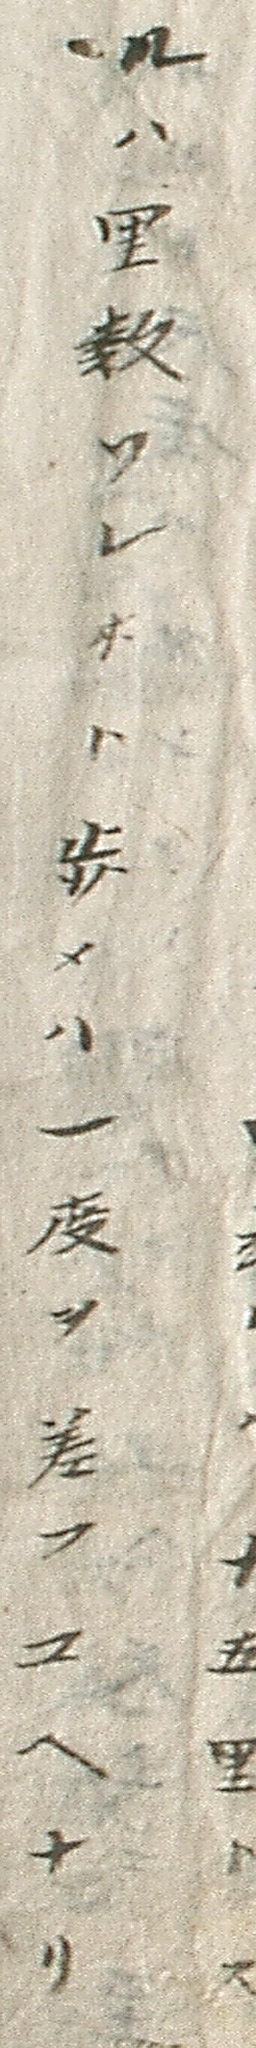ルハ里数ソレホト歩メハ一度ヲ差フユヘナリ

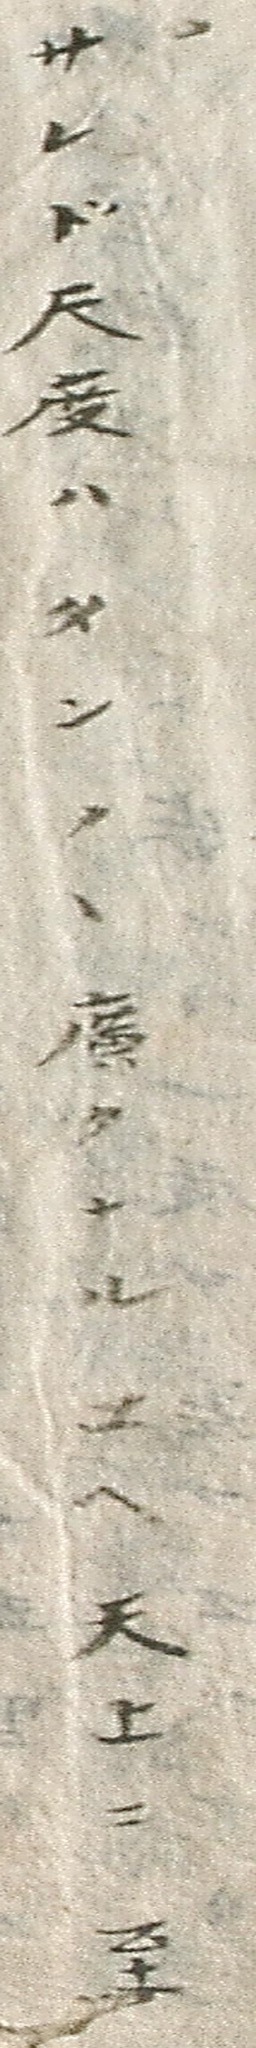サレド尺度ハタンノヽ広クナルユヘ天上ニ至
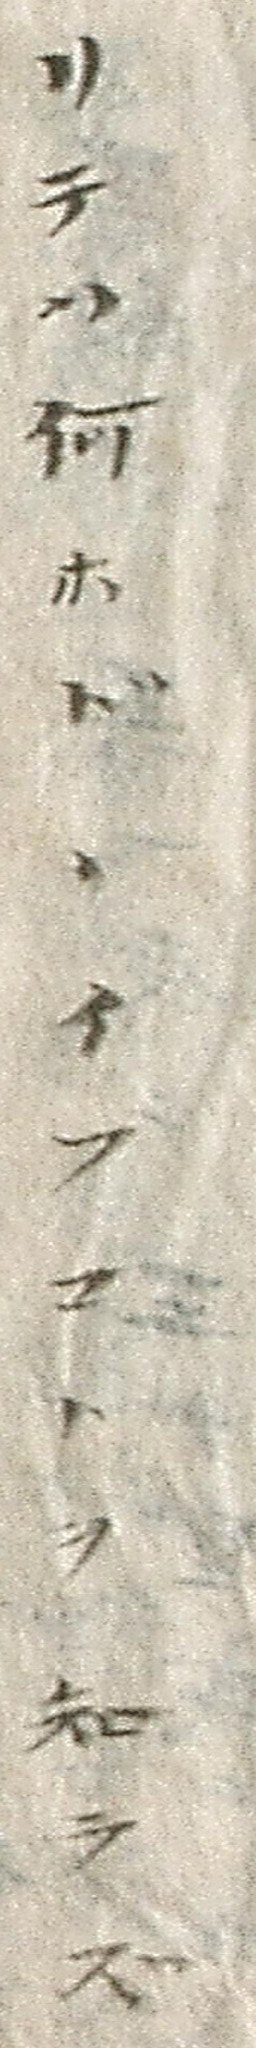リテハ何ホドヽイフコトヲ知ラズ
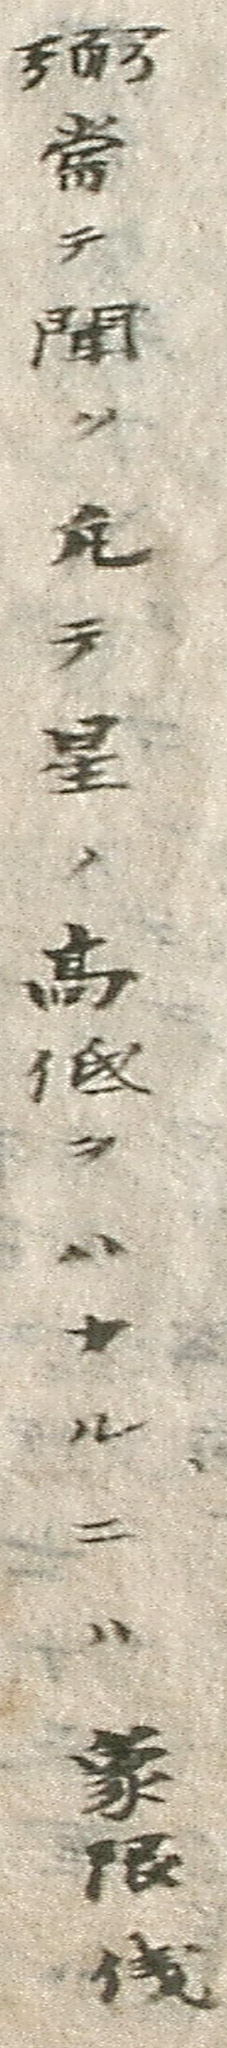弼当テ聞ク凡テ星ノ高低ヲハカルニハ象限儀
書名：天學便蒙図説
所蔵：東京大学地震研究所図書室 Earthquake Research Institute Library, The University of Tokyo, JAPAN
